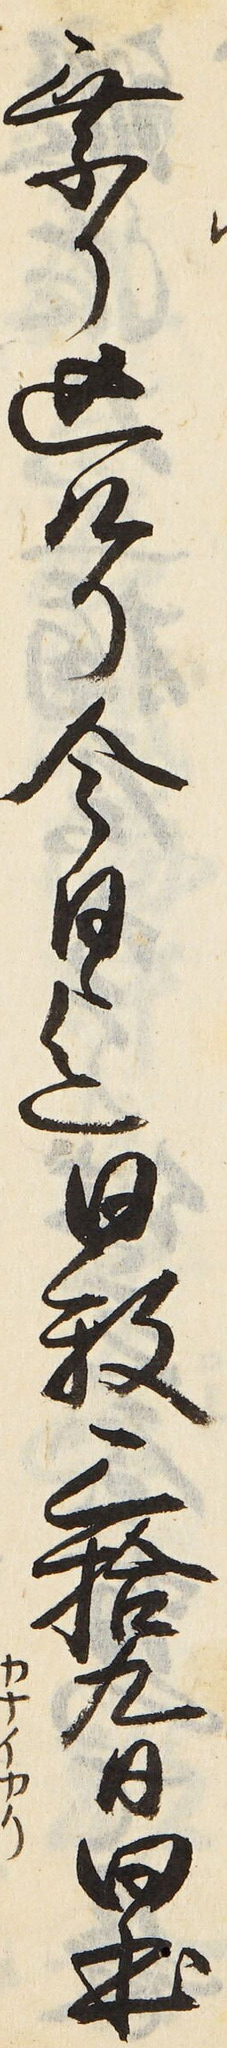乗り込けり今日迠日数三拾九日日本
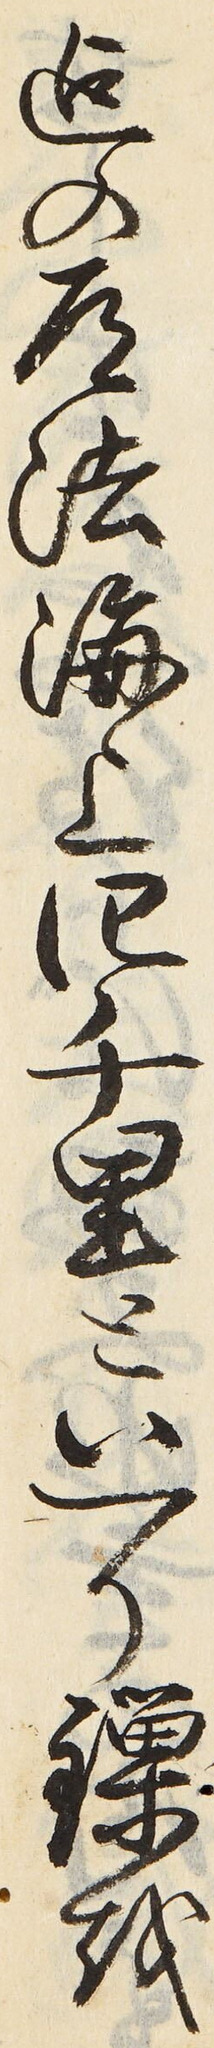迠の道法海上四千里といへり鏁を
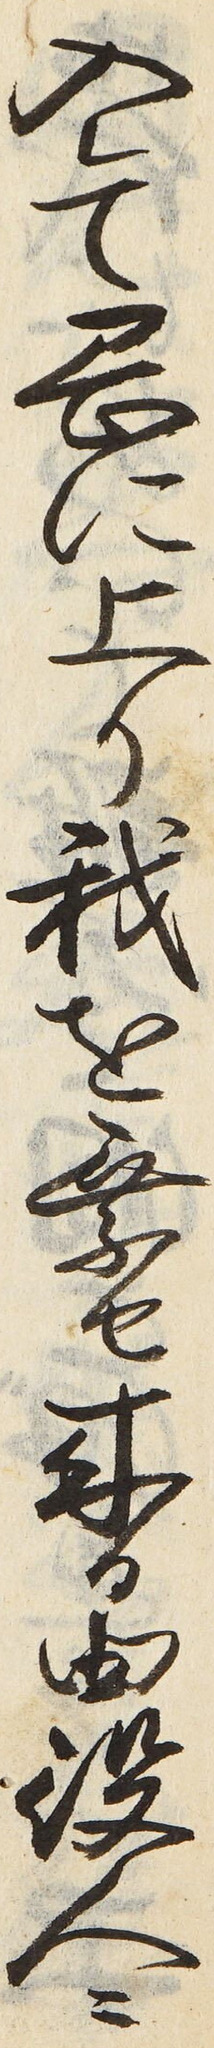入れて岡に上り我を乗せ来る由役人に
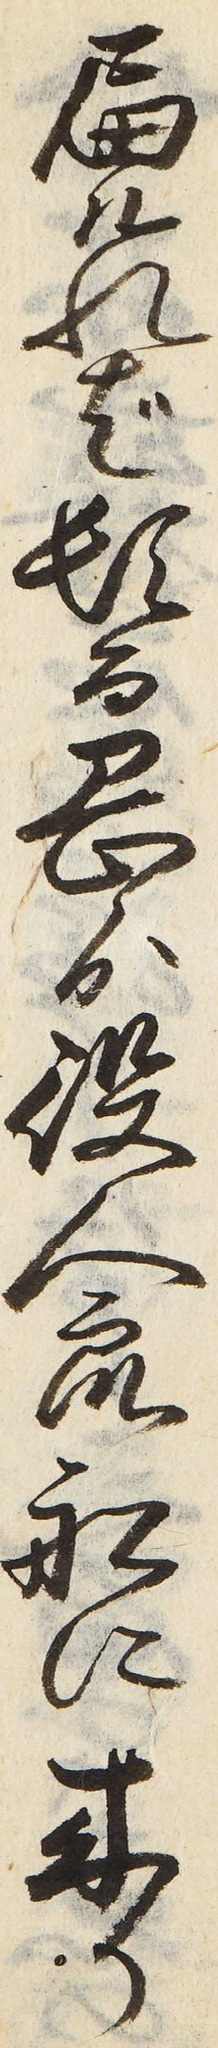届ければ頓而岡ゟ役人衆船に来り
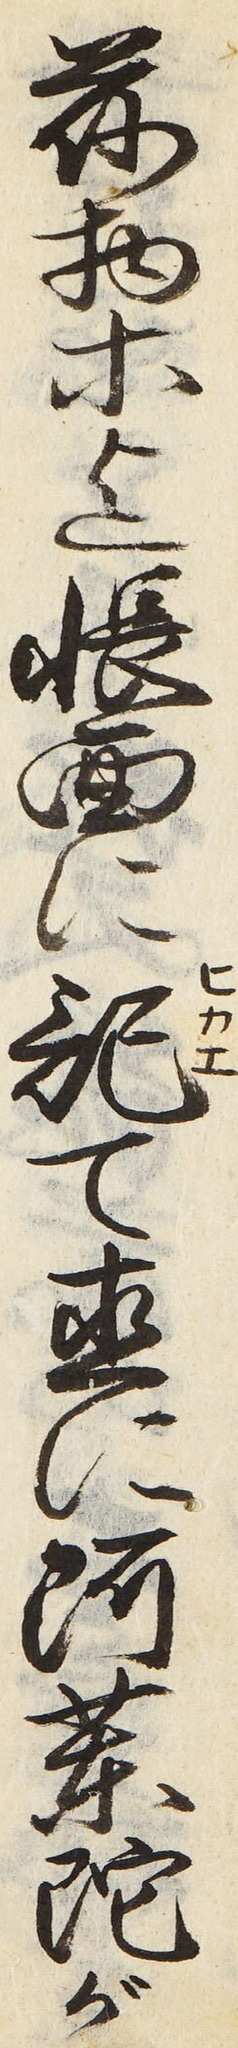荷物等迠帳面に記て直に阿蘭陀が
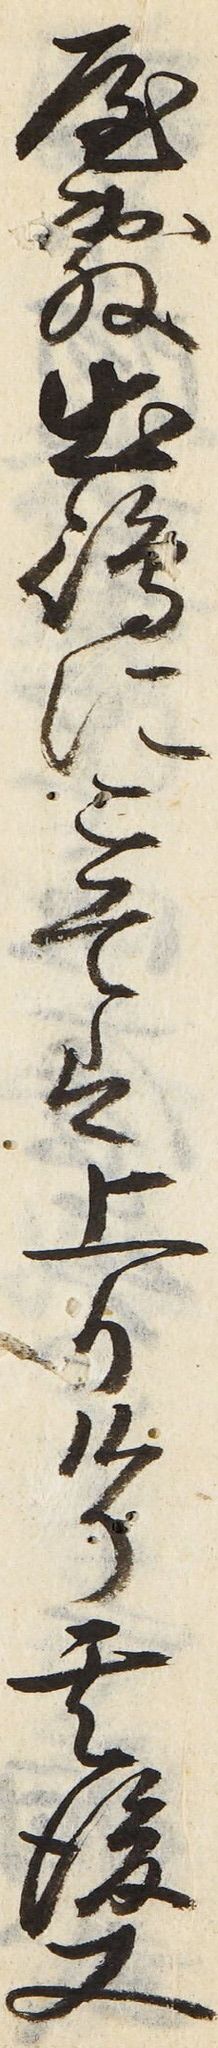屋敷出島にこそは上りけり其後又
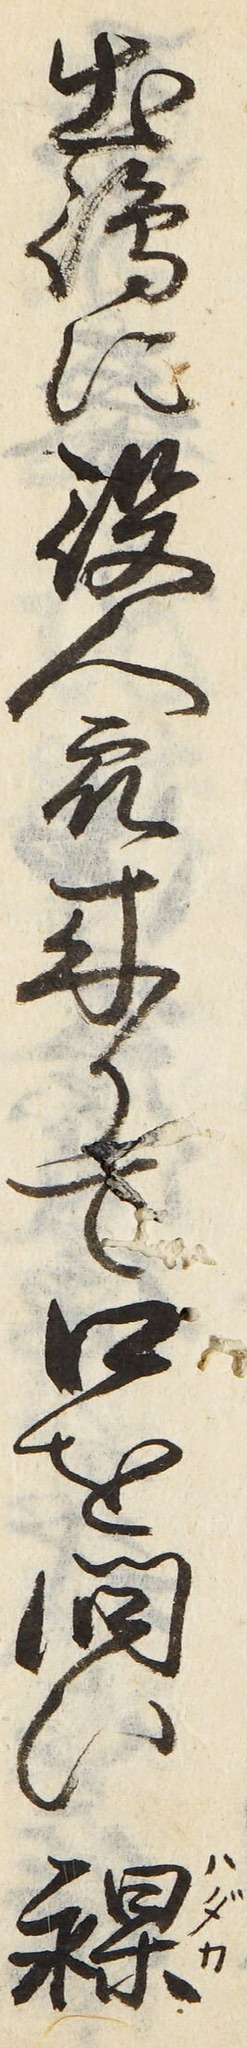出島に役人衆来りて口を問ひ裸
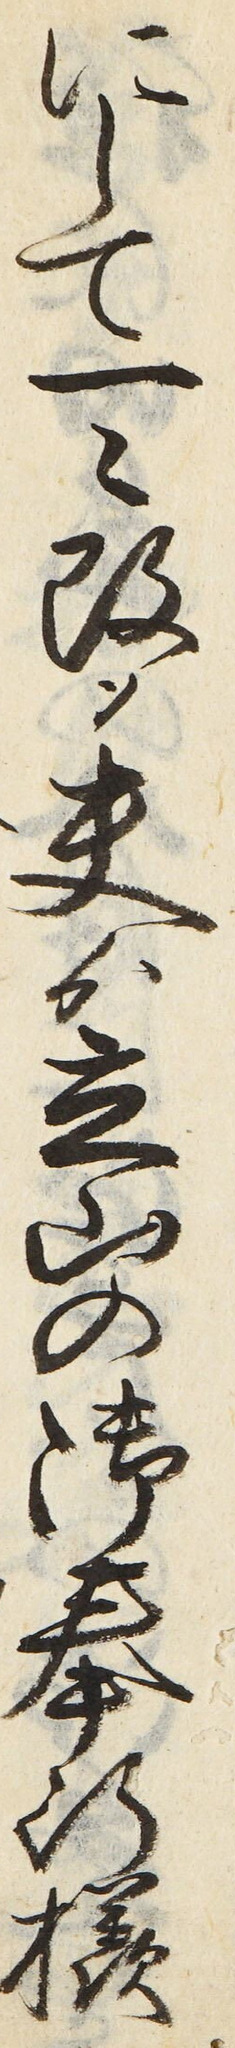にして一々改め夫ゟ立山の御奉行様
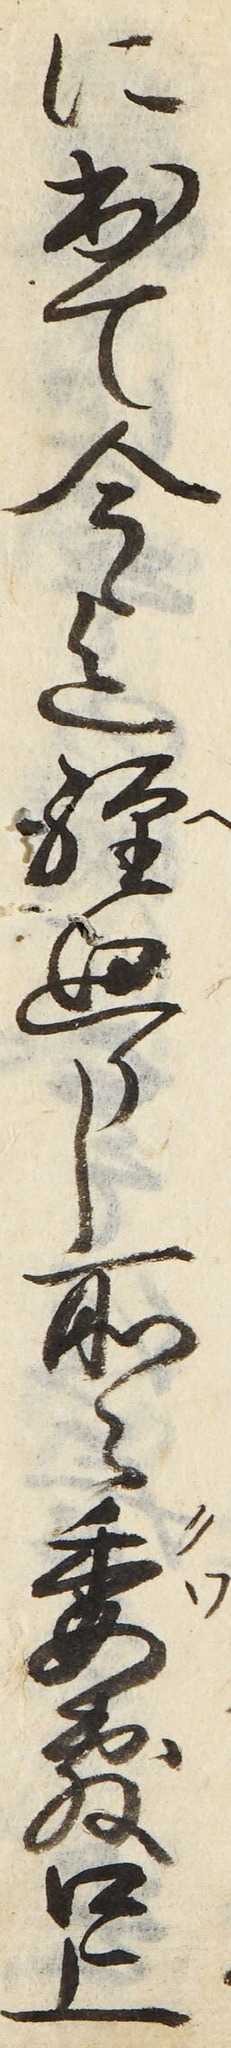に出て今迄経廻りし所々委敷口上
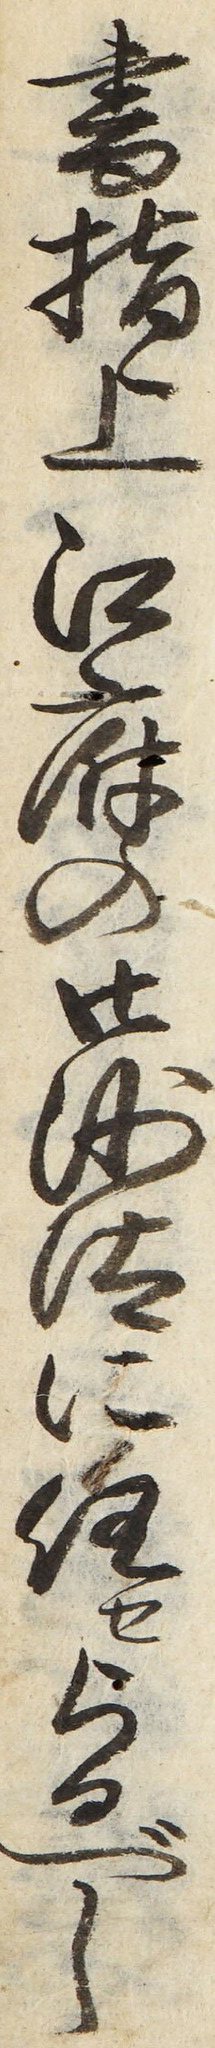書指上江府の御沙汰に任せらるべし

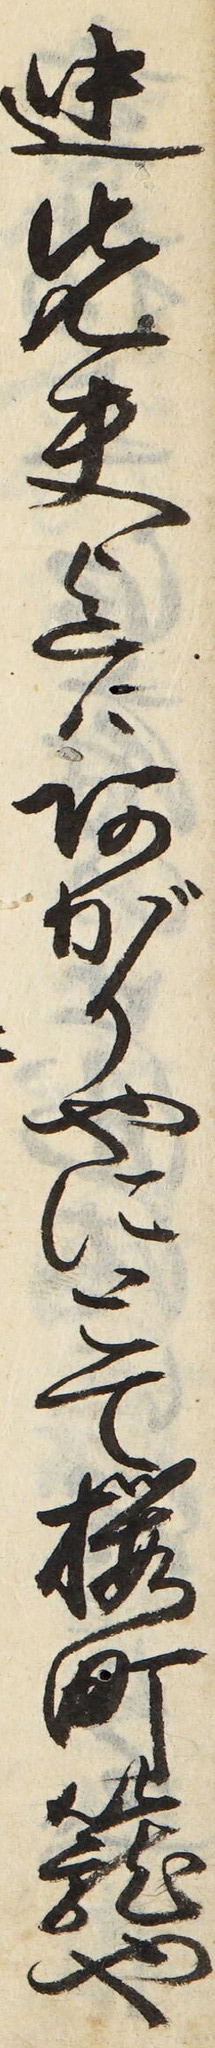迚先夫迠にあがりやにとて桜町籠や
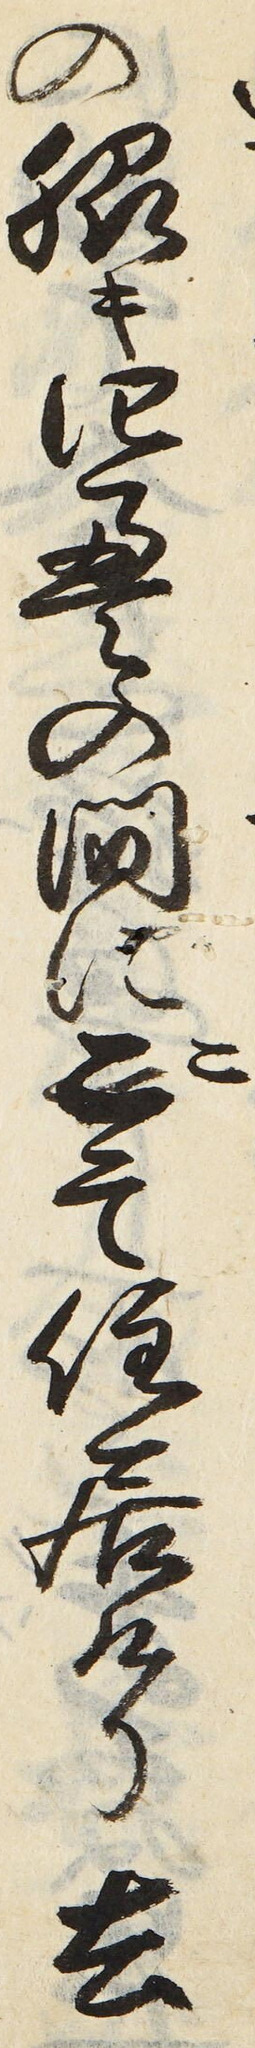の招き四畳の間にこそ住居けり去
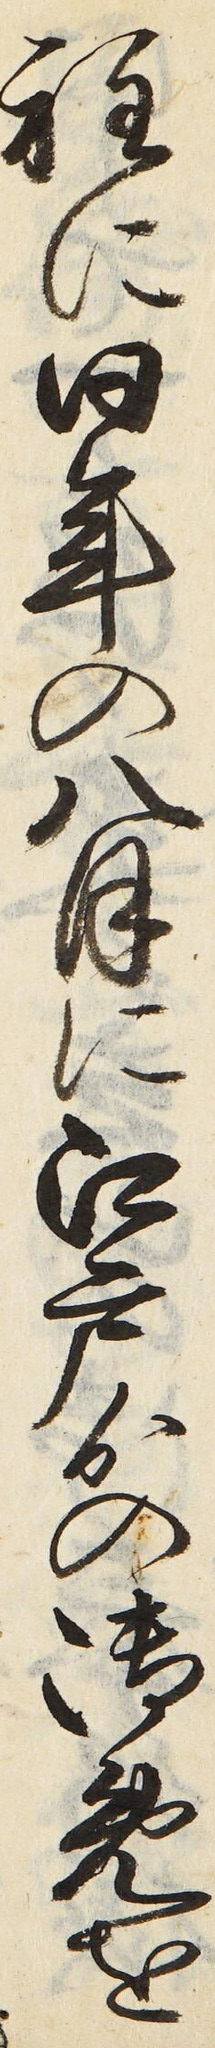程に同年の八月に江戸ゟの御免を
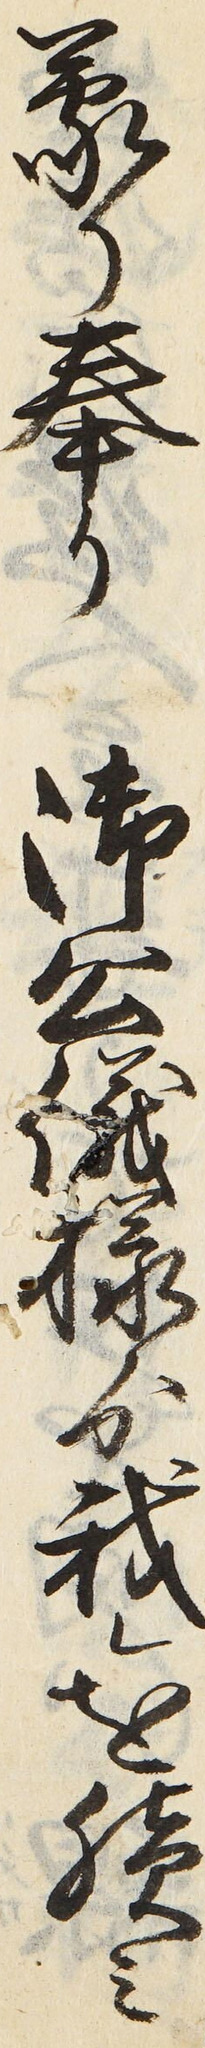承り奉り御公儀様ゟ我れを積み
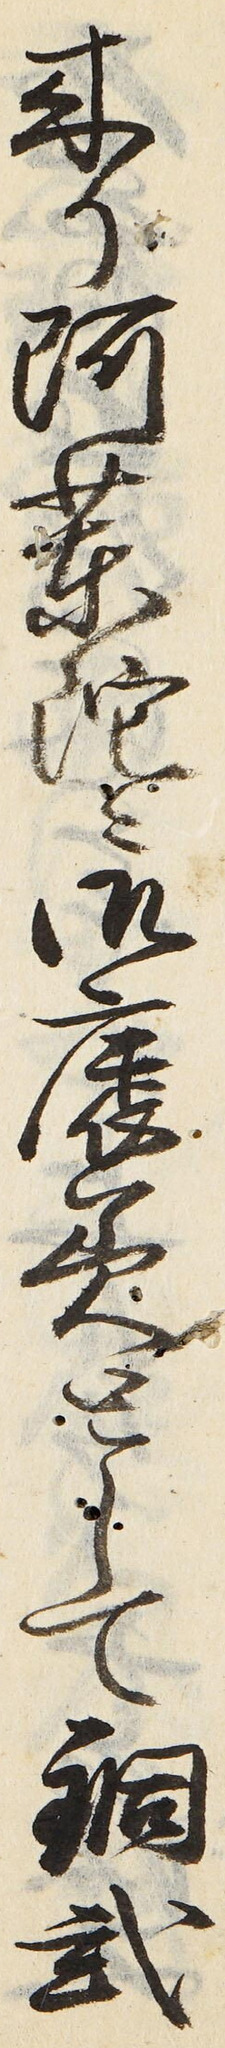来り阿蘭陀に御褒美として銅弐
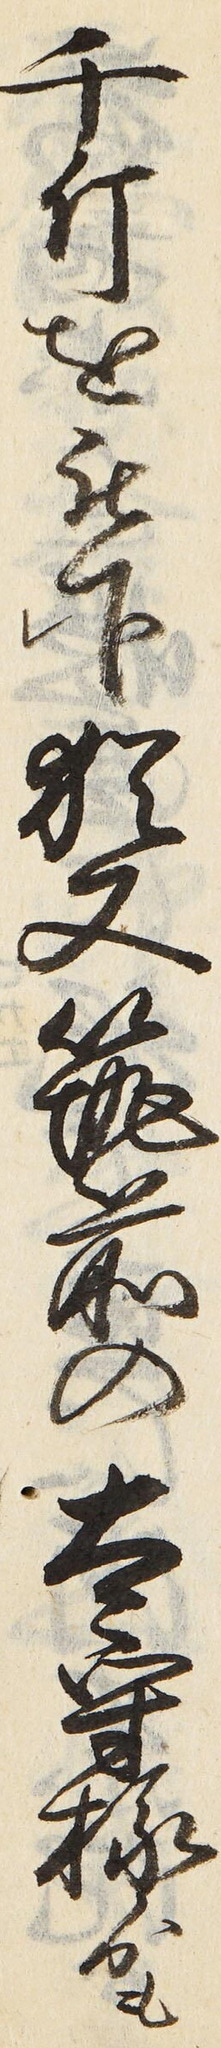千斤を被下猶又筑前の太守様ゟも
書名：華夷九年録
